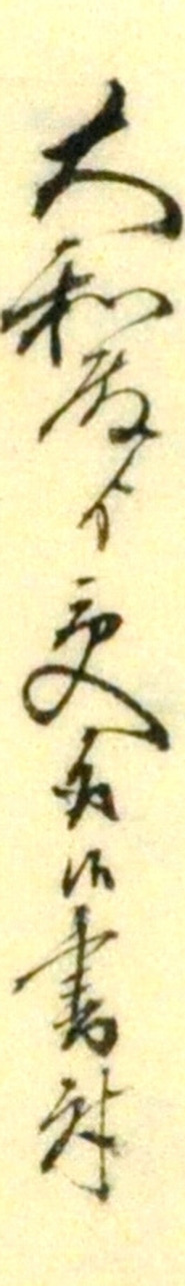大和殿ゟ受取候書付

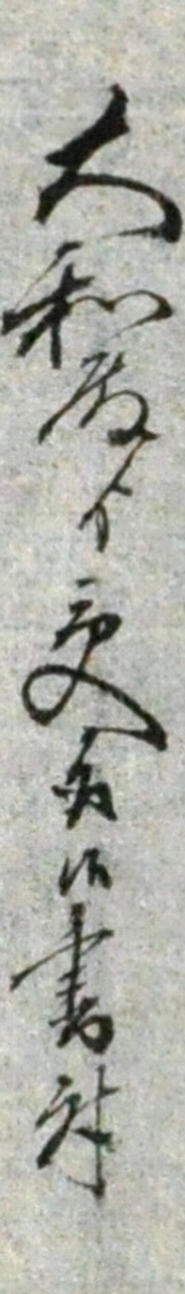大和殿ゟ受取候書付

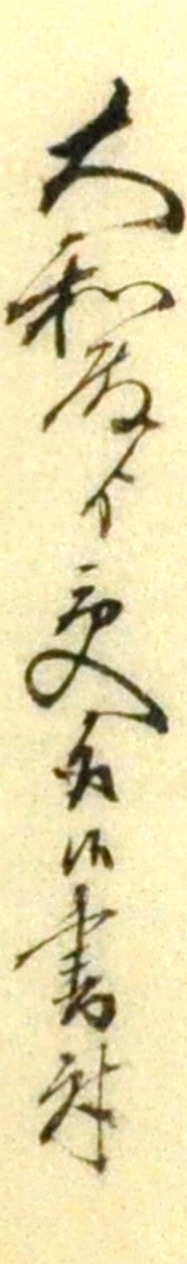大和殿ゟ受取候書付

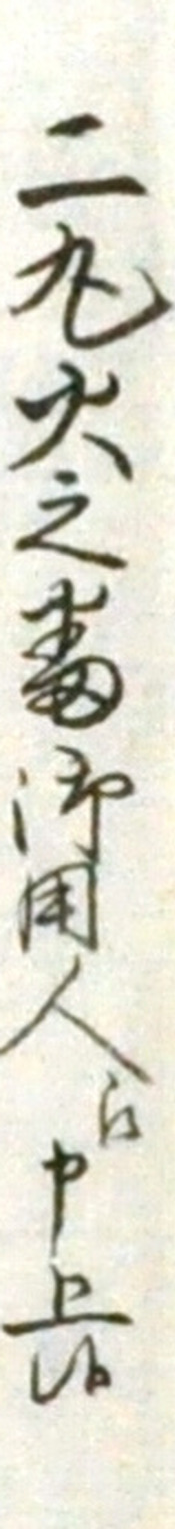二丸火之番御用人江申上候
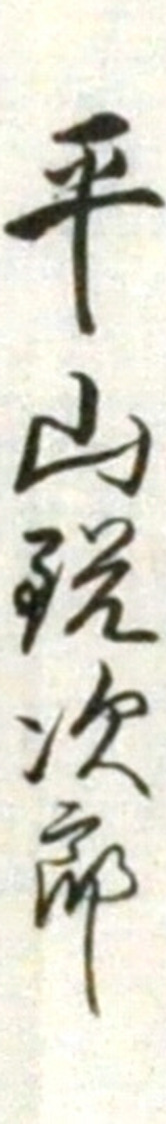平山鋭次郎
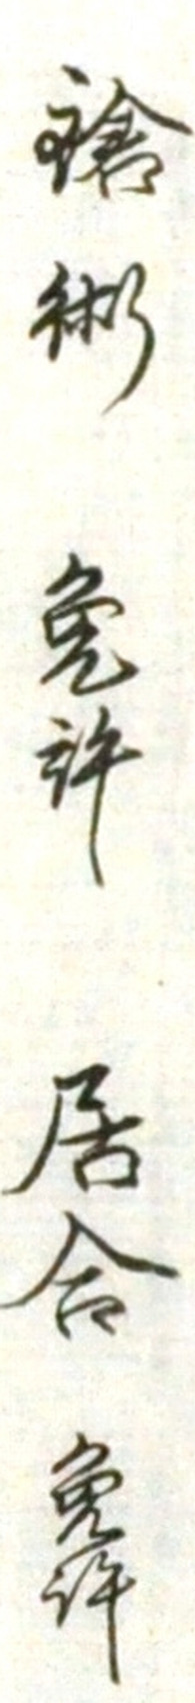鎗術免許居合免許
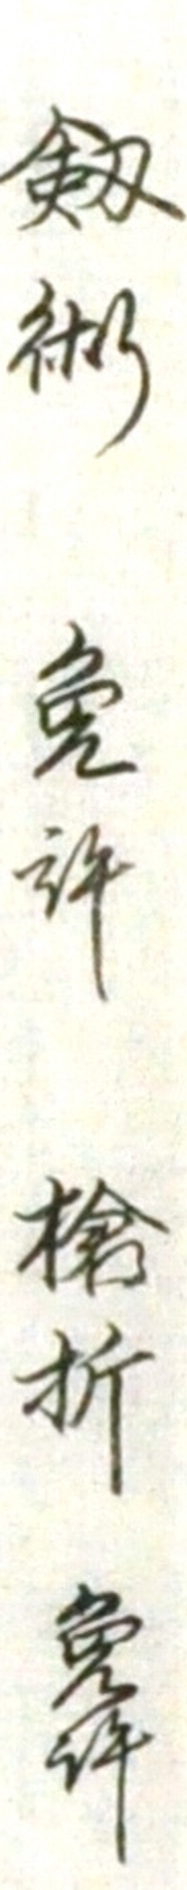剣術免許槍折免許
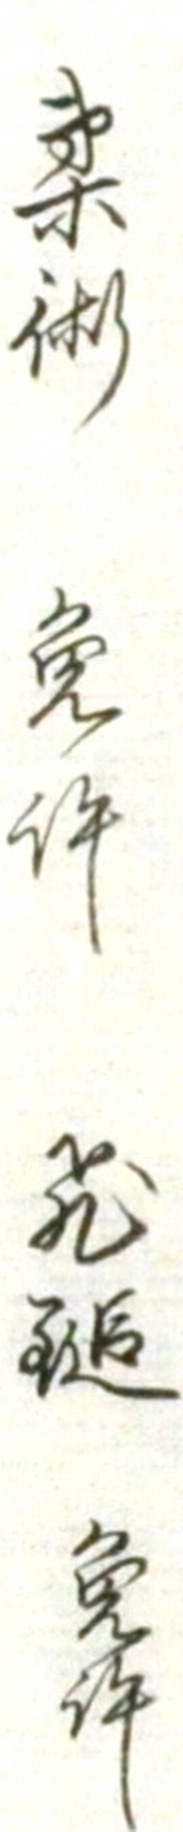柔術免許飛鎚免許
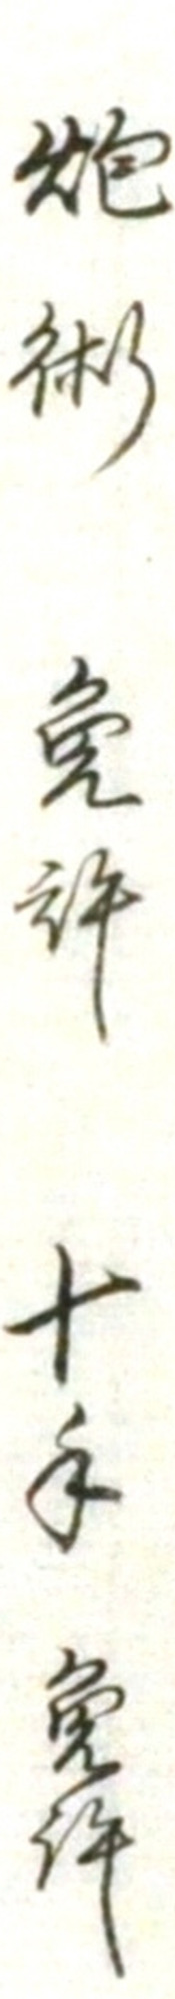炮術免許十手免許
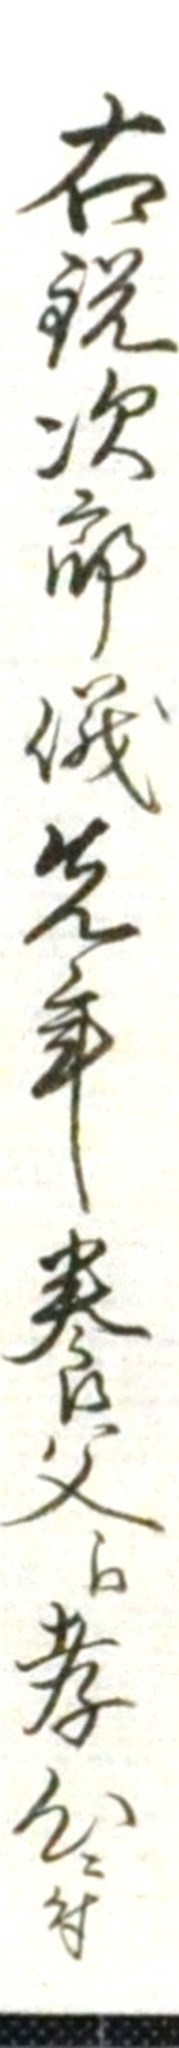右鋭次郎儀先年養父江孝心ニ付
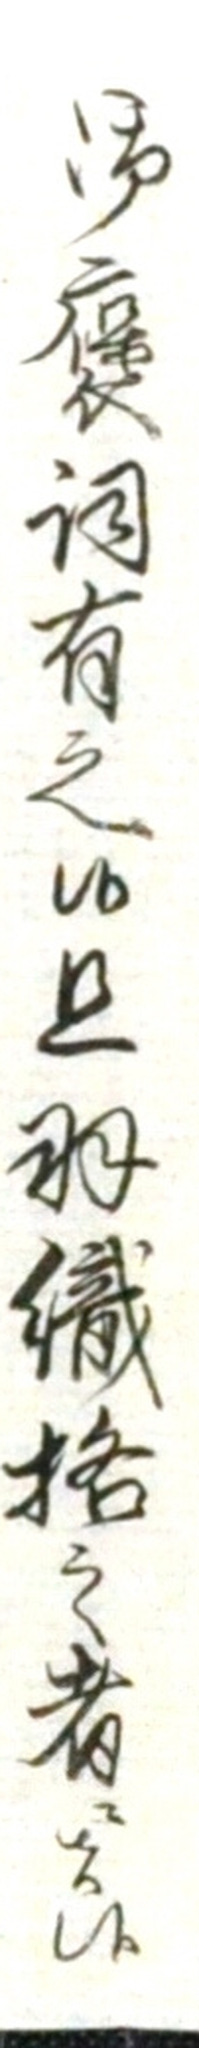御褒詞有之候且羽織格之者ニ者候
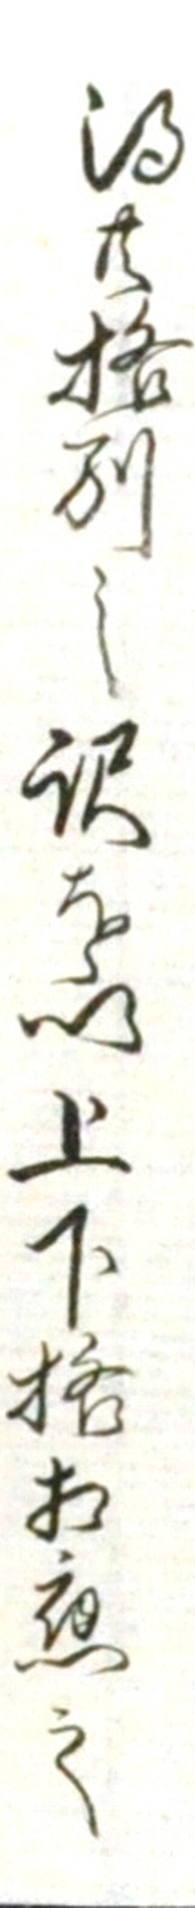得共格別之訳を以上下格相応之
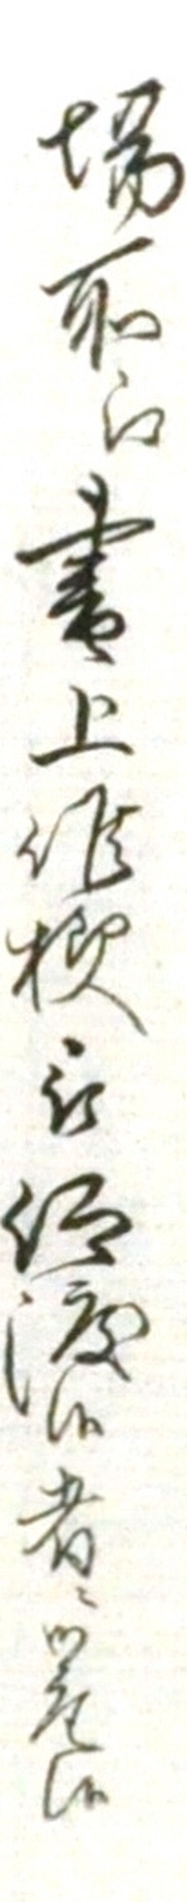場所江書上候様被仰渡候者ニ御座候
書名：大和殿より受取候書付
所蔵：伊那市立高遠町図書館・合同会社AMANE
